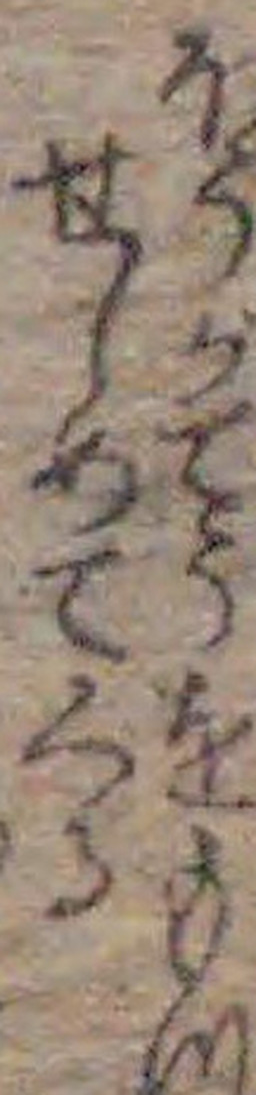せしめてくる
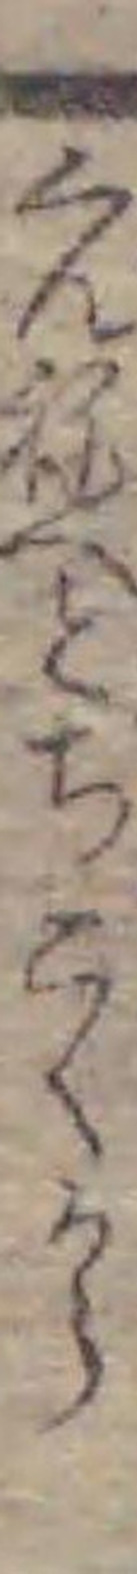くんねへとちこくから
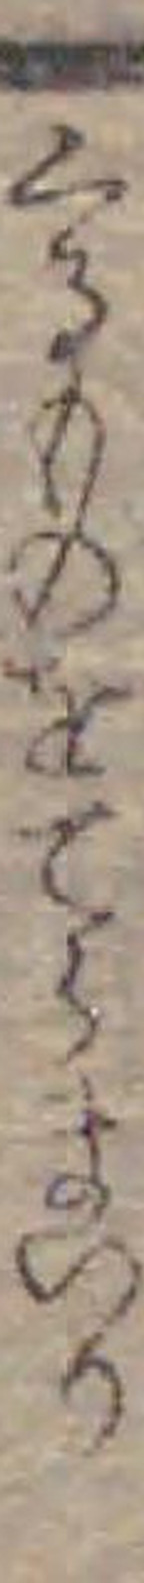くるものをてらまいり
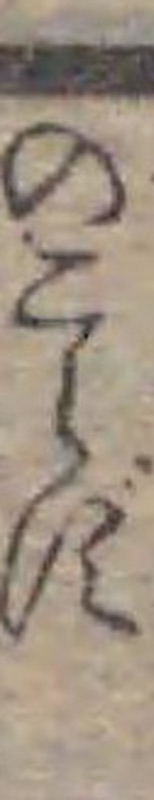のこらず
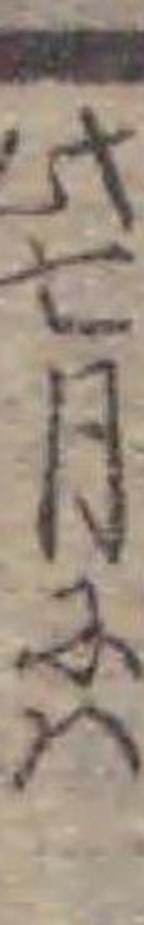此七月には
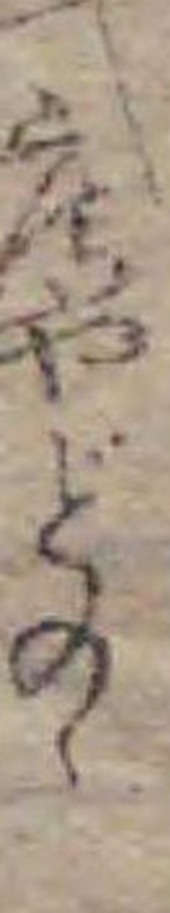〽庄やどのゝ
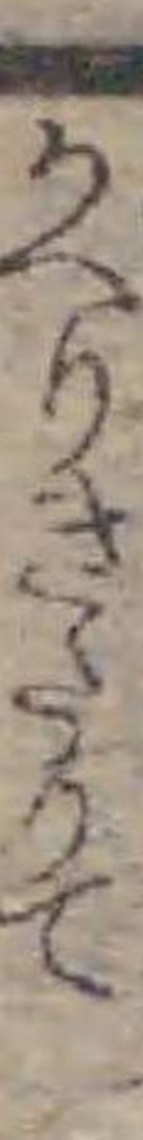かへりきたりて
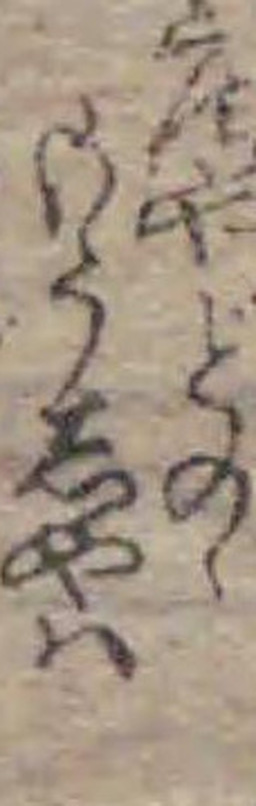もうしやは
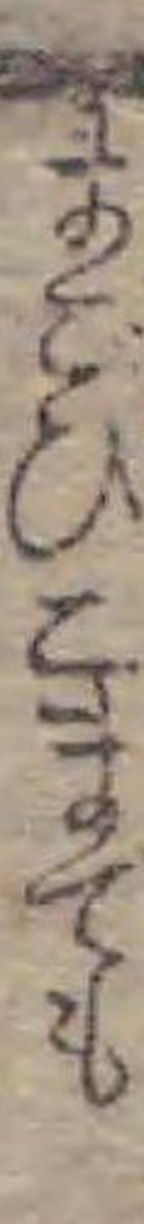まごひこまでも
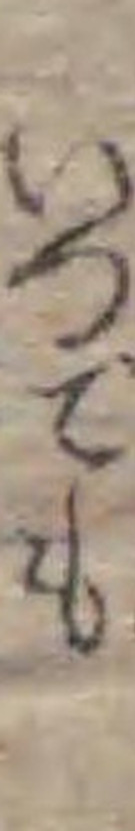いつでも
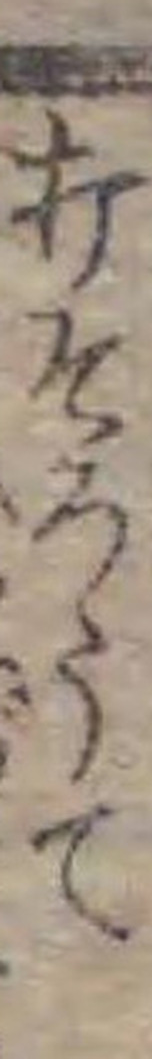打そろうて
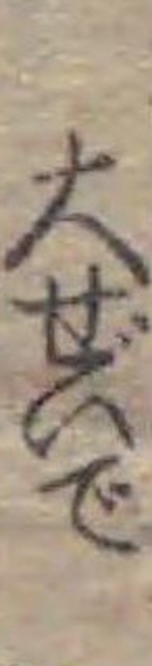大ぜいで
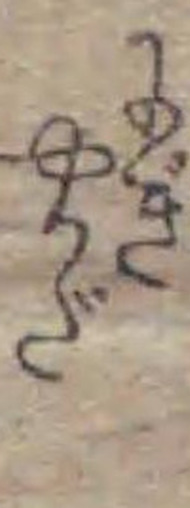やかだ
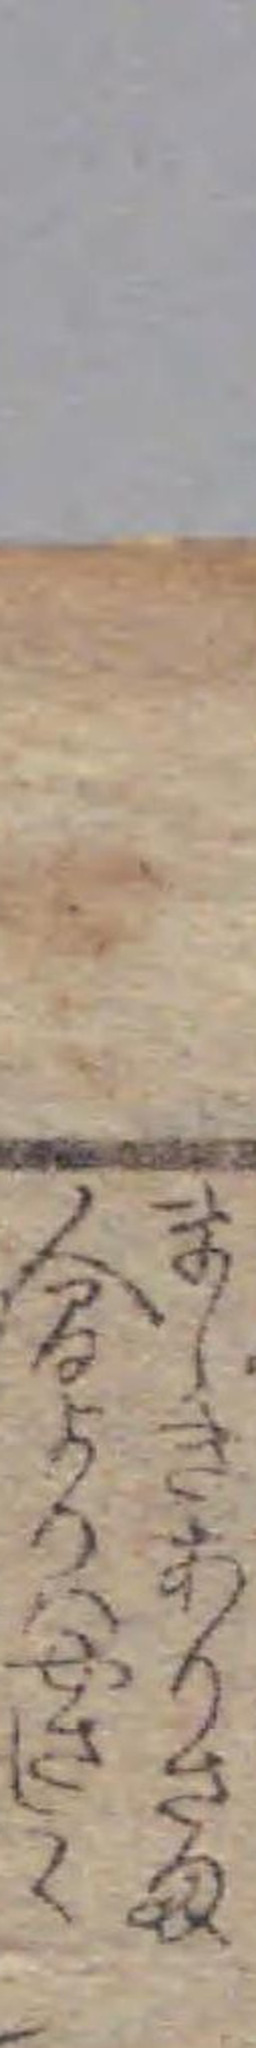人間よりはやさしく
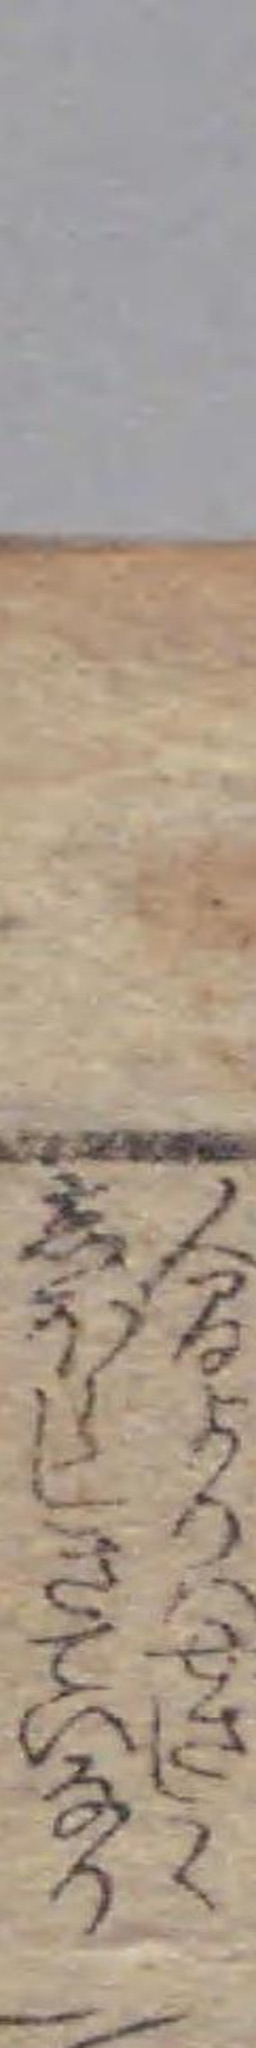しほらしきていなり
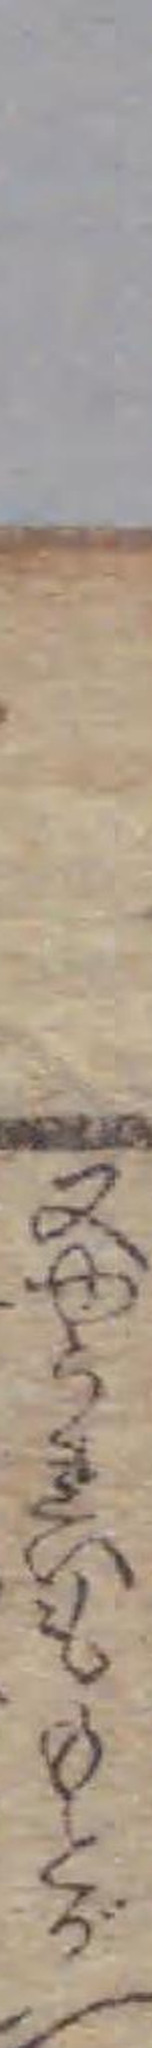又やうれいももとが
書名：年中行状記 : 2巻
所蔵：国立国会図書館 National Diet Library, JAPAN
